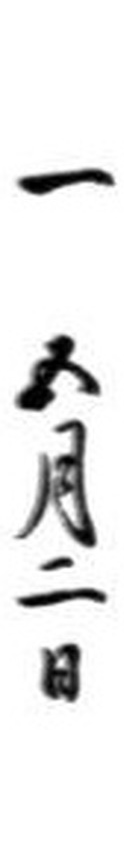一五月二日
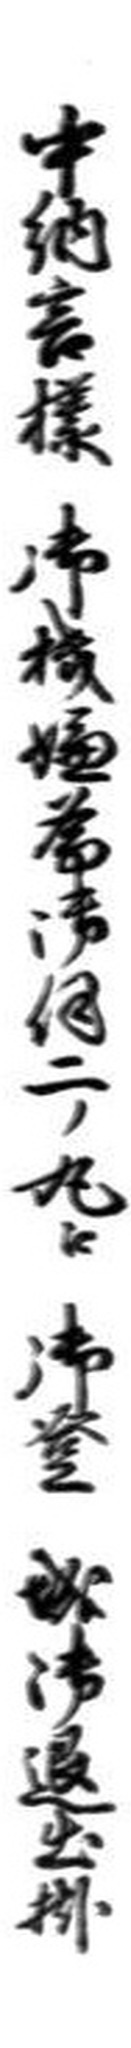中納言様御機嫌為御伺二ノ丸江御登城御退出掛
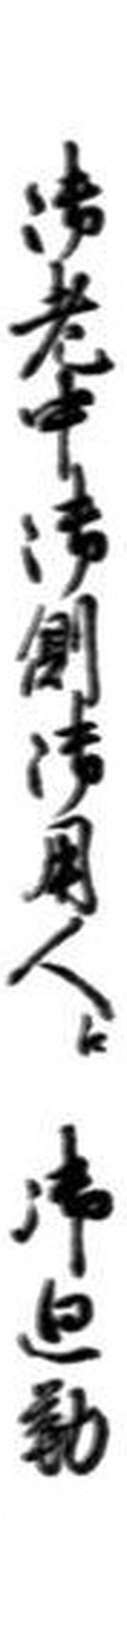御老中御側御用人江御廻勤
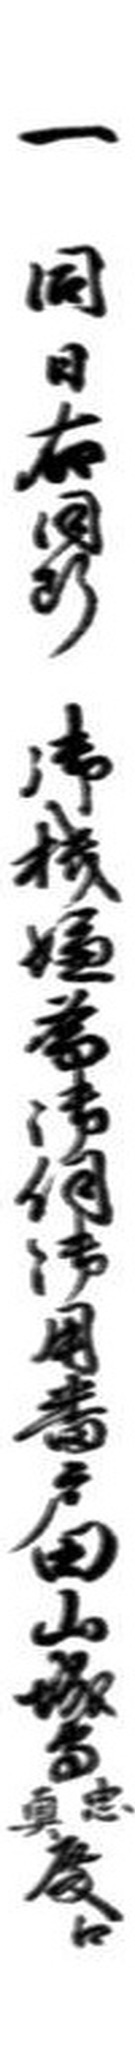一同日右同断御機嫌為御伺御用番戸田山城守忠真殿江
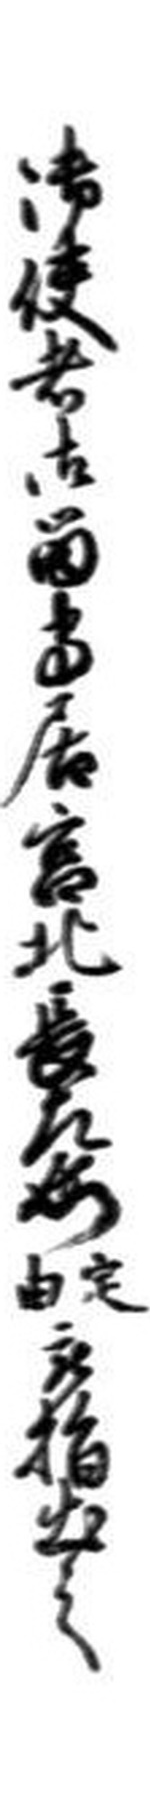御使者御留守居宮北長左衛門定由被指出之
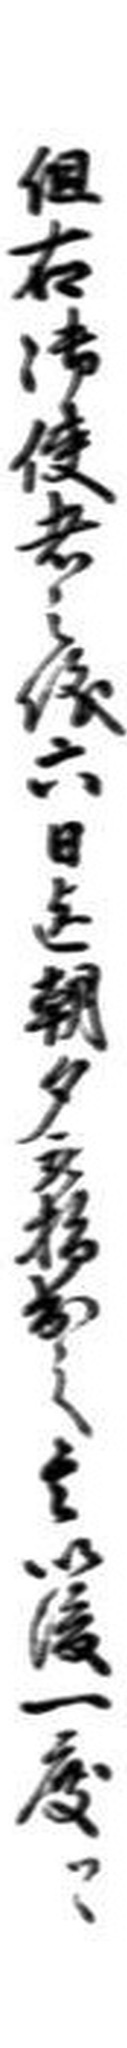但右御使者之儀六日迄朝夕被指出之其以後一度ツヽ
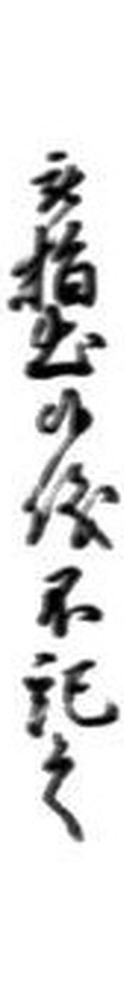被指出候儀不記之
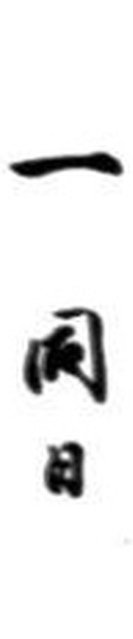一同日
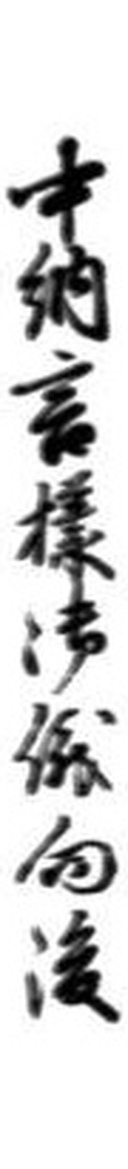中納言様御儀向後
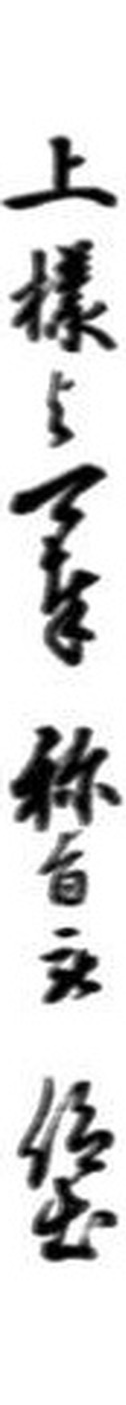上様と可奉称旨被仰出

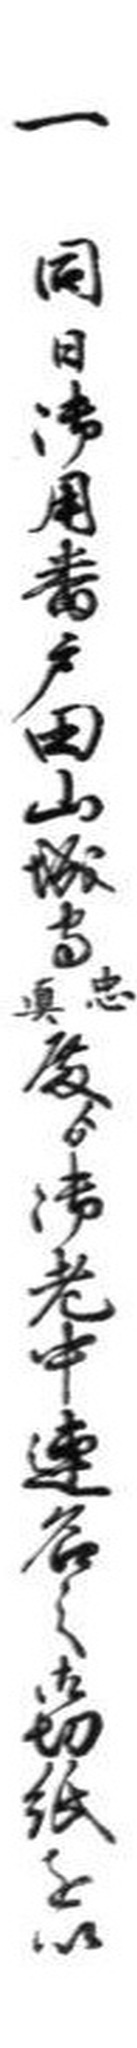一同日御用番戸田山城守忠真殿ゟ御老中連名之御切紙を以
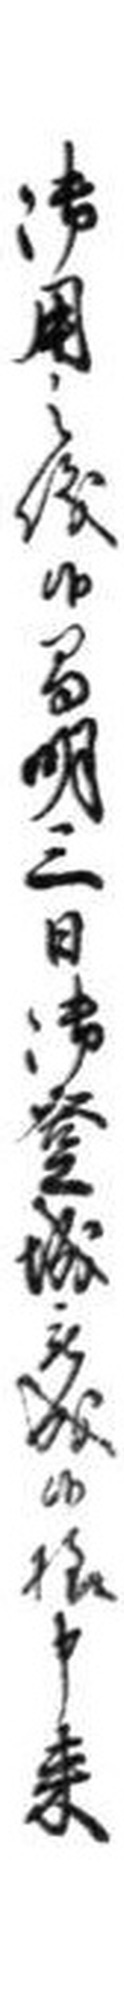御用之儀候間明三日御登城被成候様申来
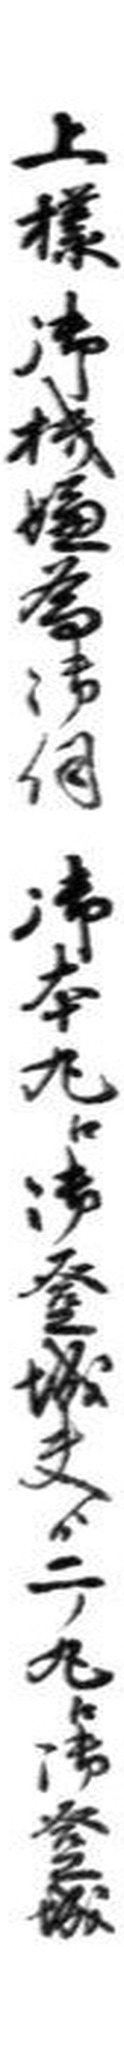上様御機嫌為御伺御本丸江御登城夫ゟ二ノ丸江御登城
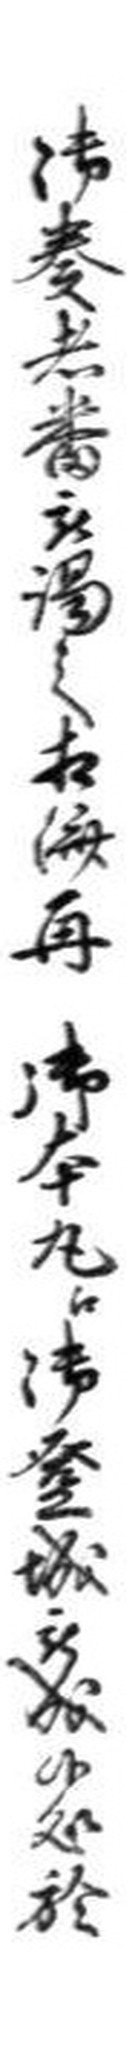御奏者番被謁之相済再御本丸江御登城被成候処於
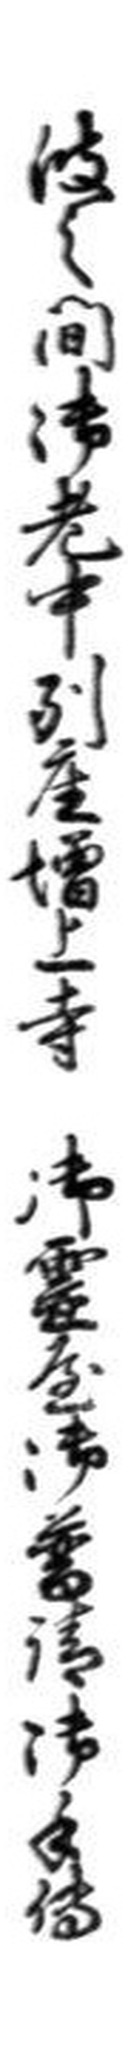波之間御老中列座増上寺御霊屋御普請御手伝
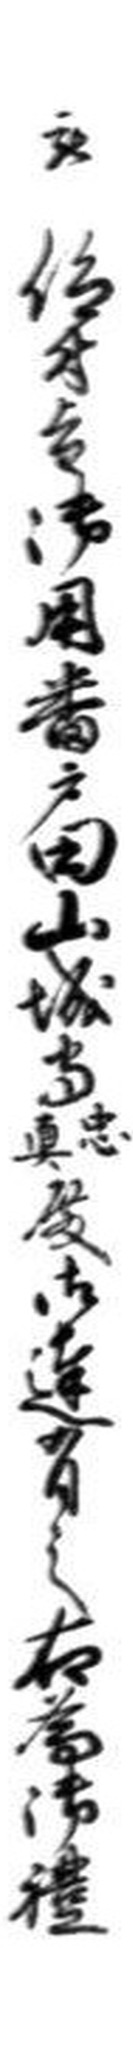被仰付旨御用番戸田山城守忠真殿御達有之右為御礼
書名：家譜 三十一 吉邦公 享保元年
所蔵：福井県文書館 Fukui Prefectural Archives
